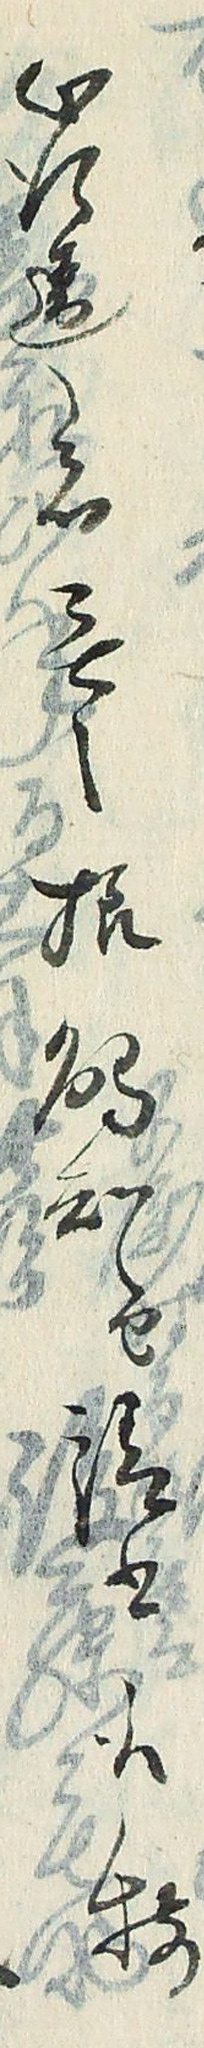心得違之者無之様触知せ請書取揃
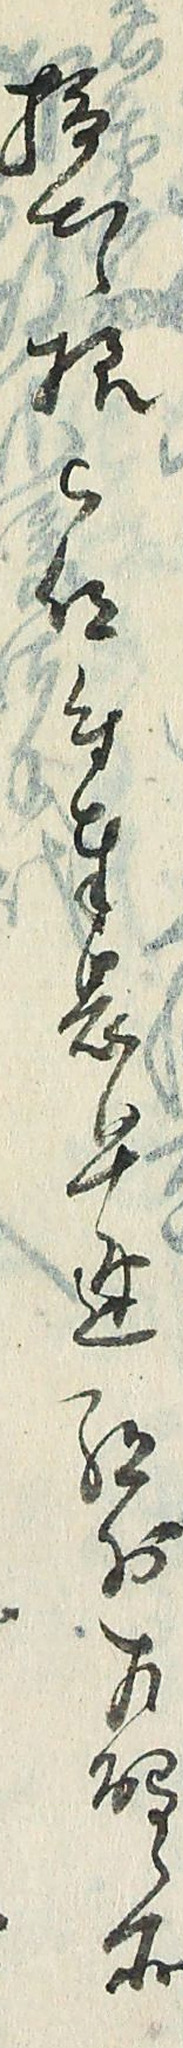指出候様被仰付奉畏早速組村相触候所
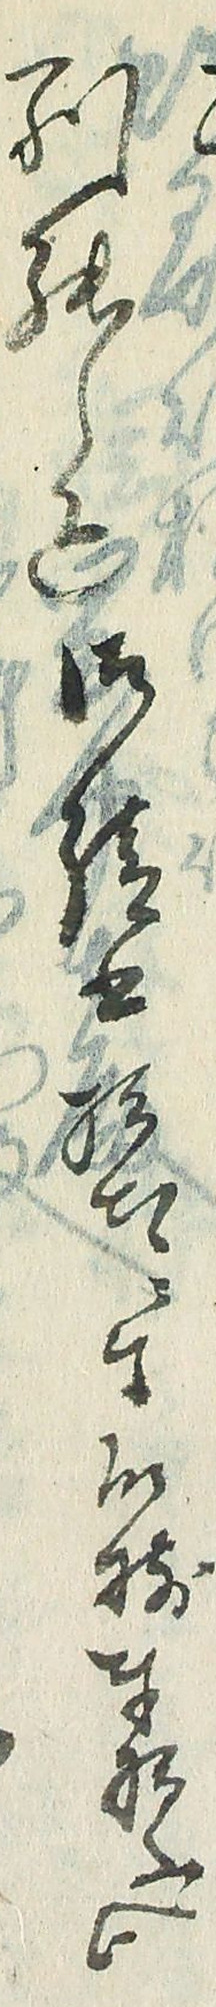別紙之通御請書指出候に付取揃奉指上候以上
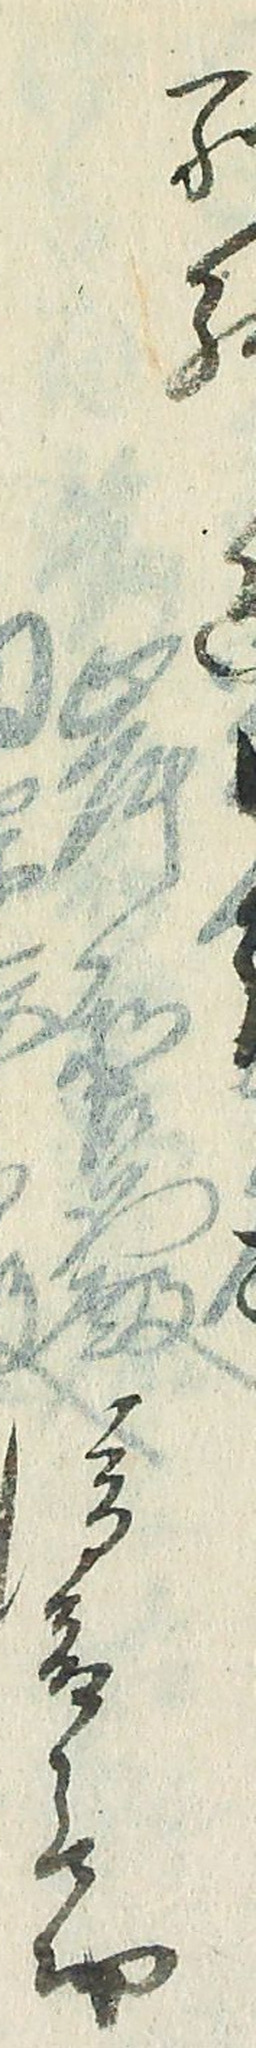後藤庄助
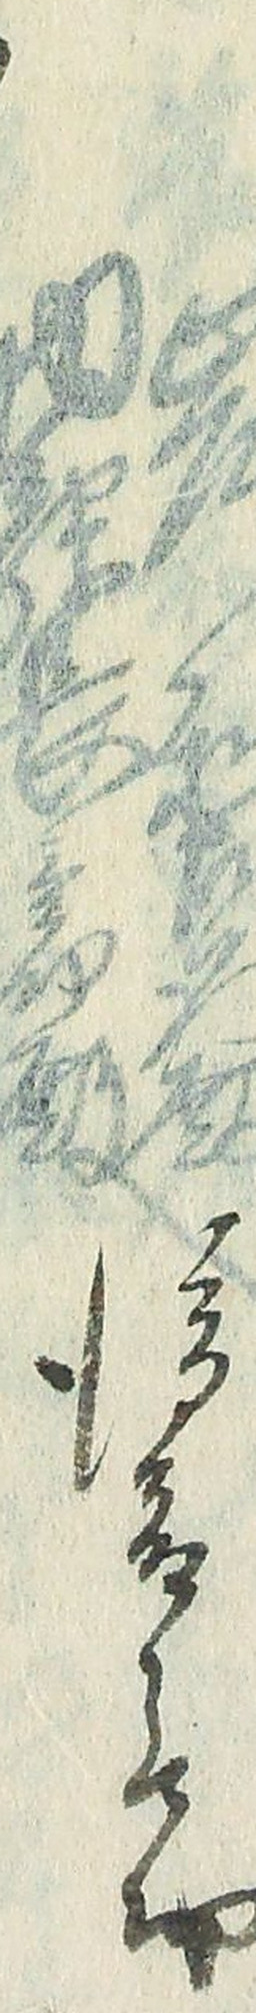後藤庄助
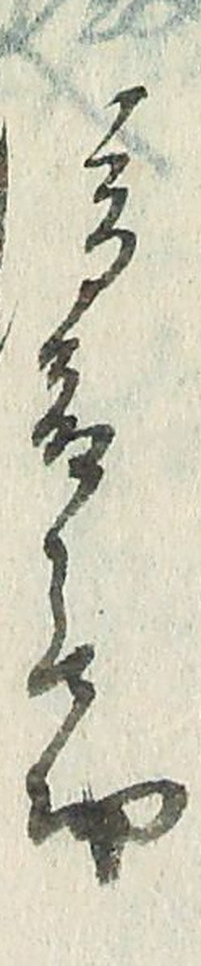後藤庄助
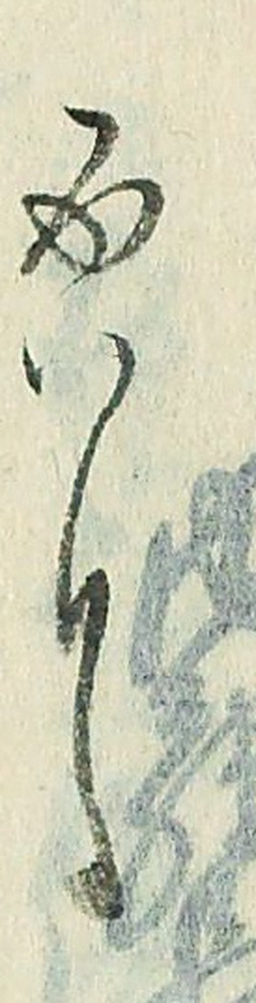酉八月
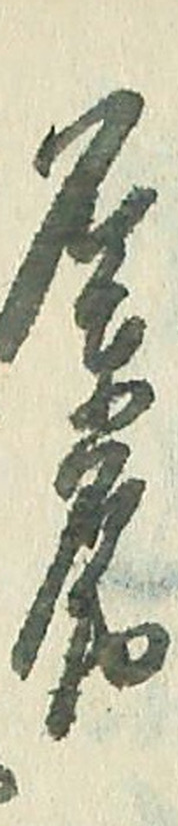名東名西
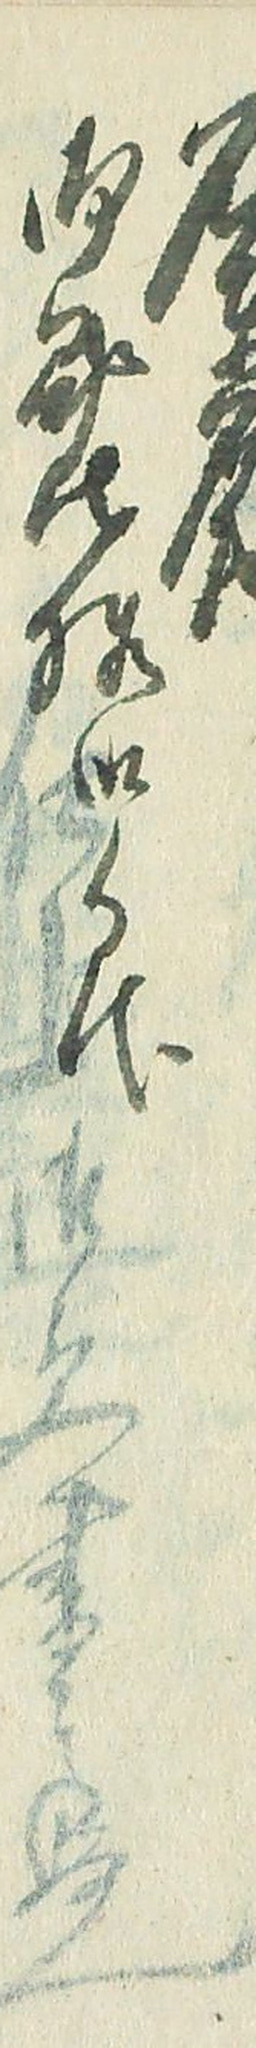御郡代様御手代
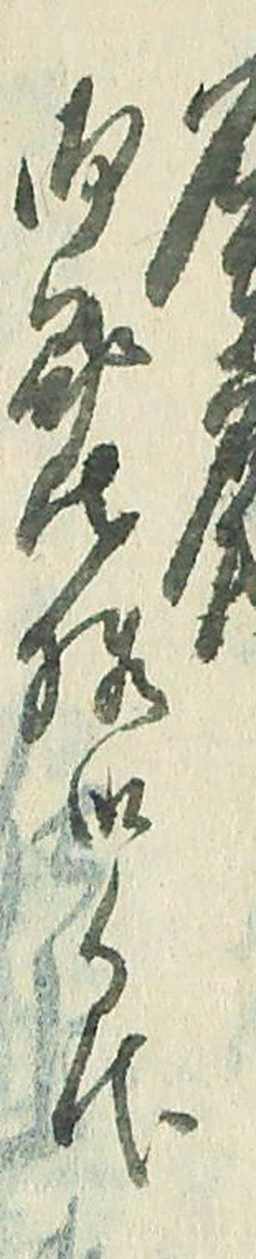御郡代様御手代
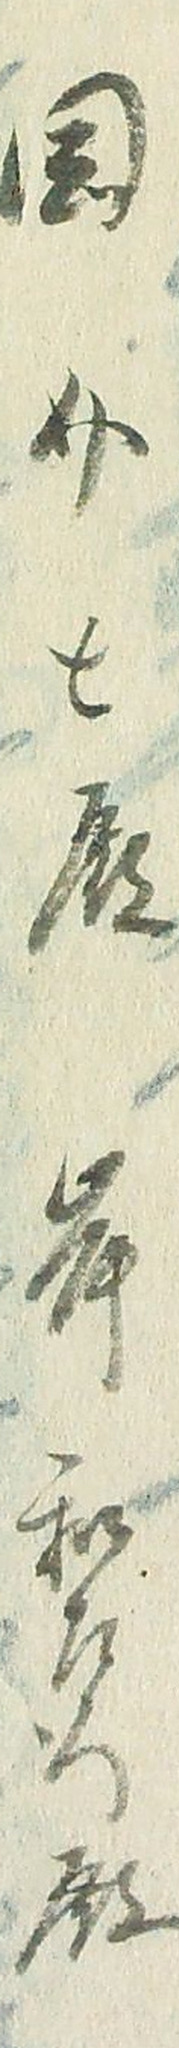岡介七殿岸和左衛門殿
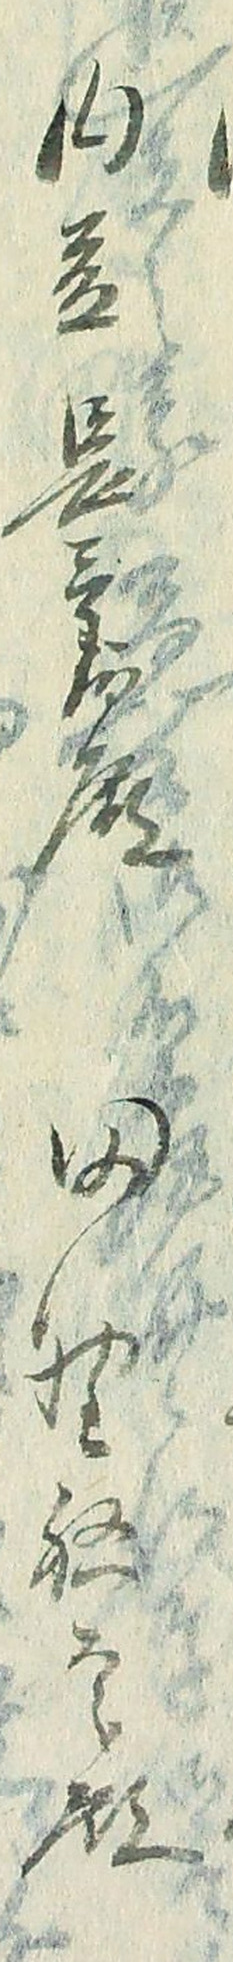内藤長三郎殿田野裕太郎殿
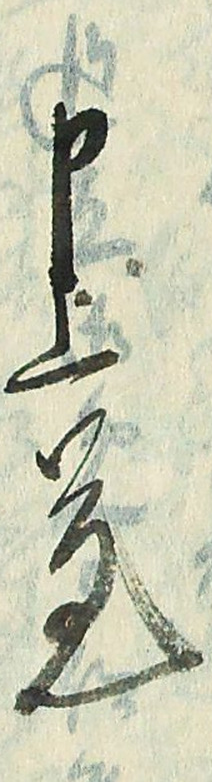申上覚
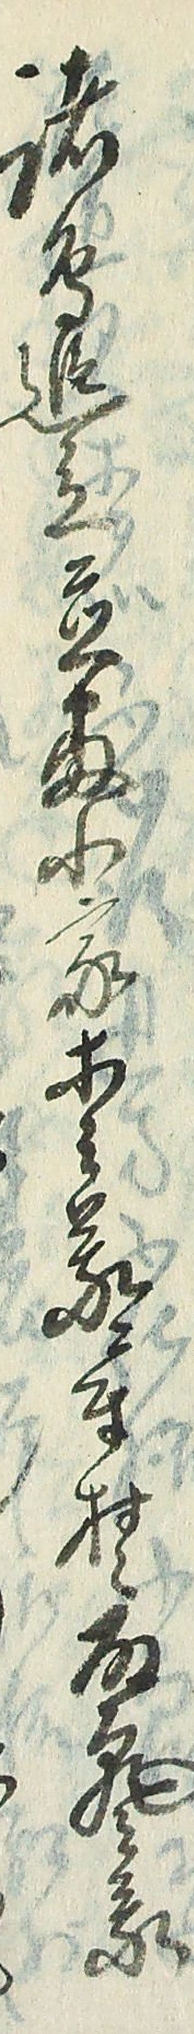諸鳥追立並番小屋等之義に付村々取究之義
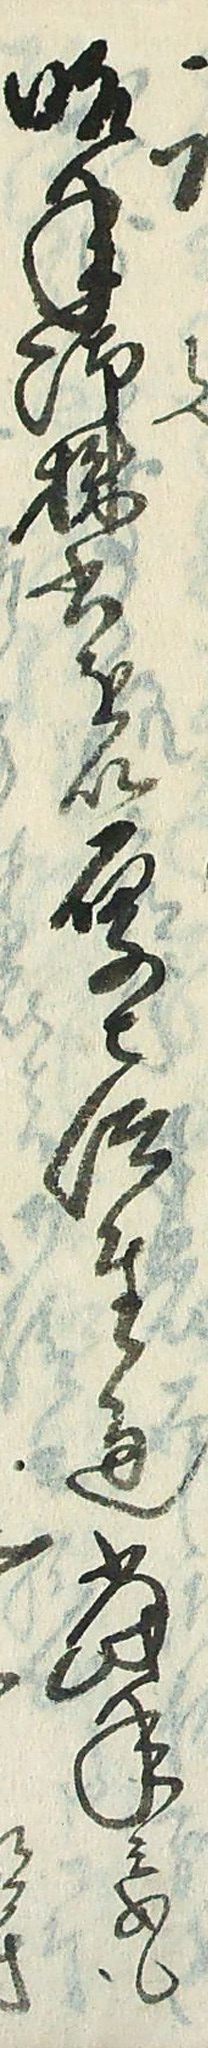昨年御株書を以厚被仰付候通当年之義も
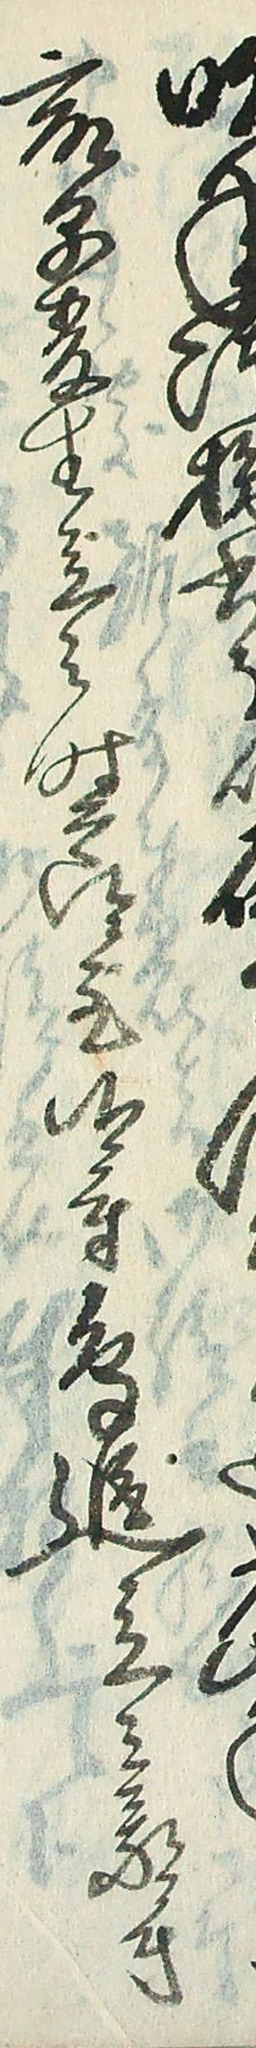最早麦生立之時節に至候に付鳥追立之義に付
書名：諸御用御□受書控
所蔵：鳴門教育大学 Naruto University of Education
